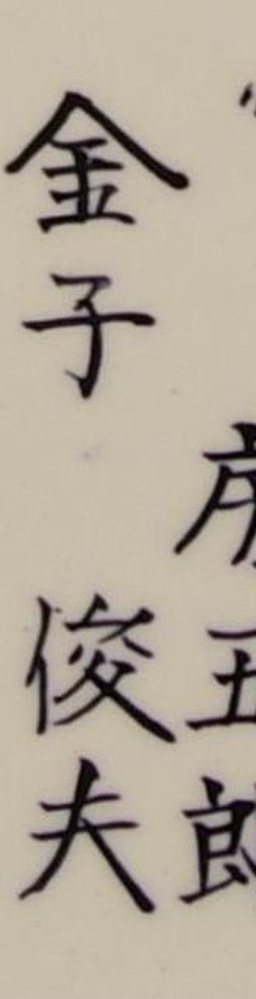金子俊夫
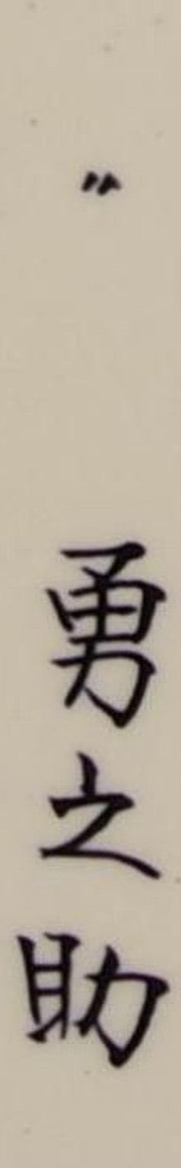勇之助
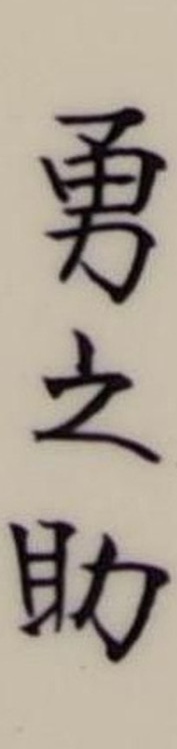勇之助

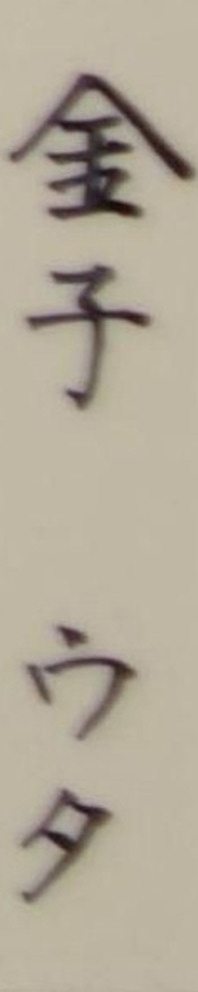金子ウタ
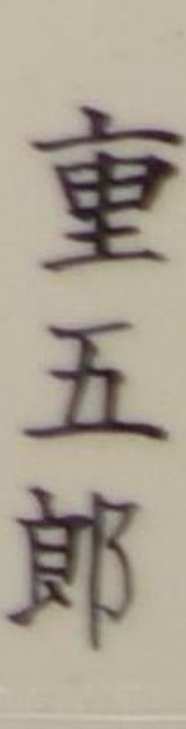重五郎
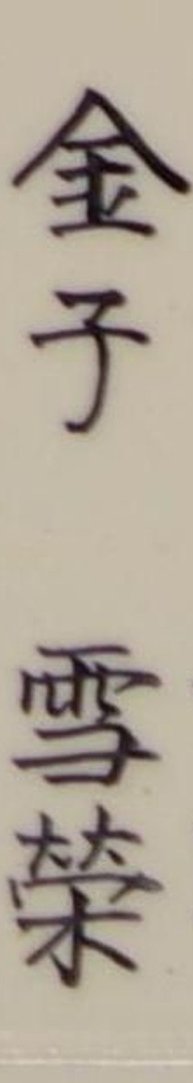金子雪榮
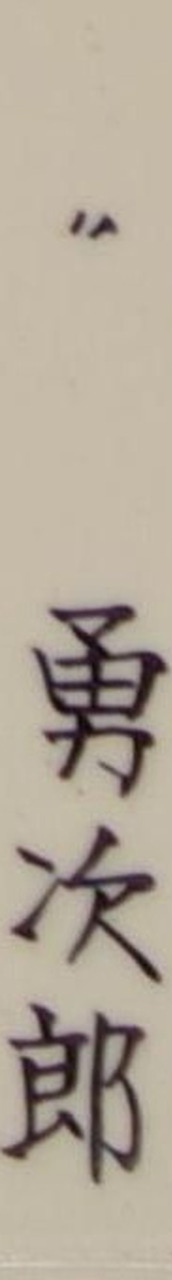勇次郎
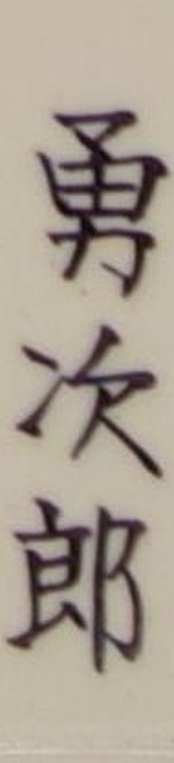勇次郎
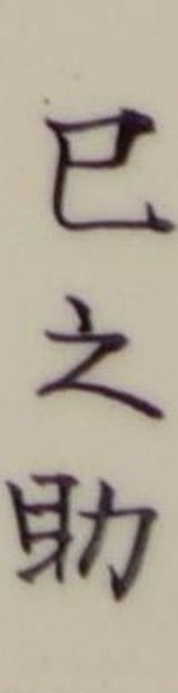巳之助
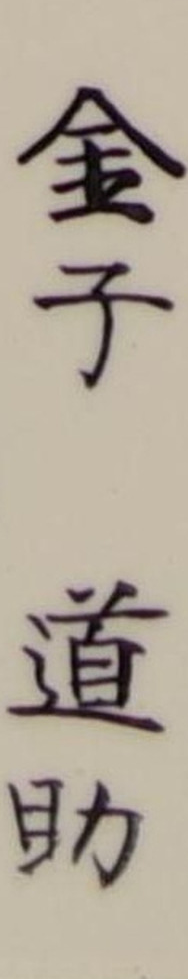金子道助
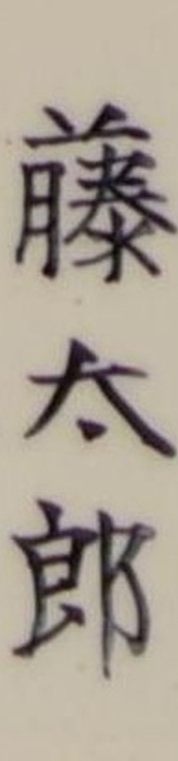藤太郎
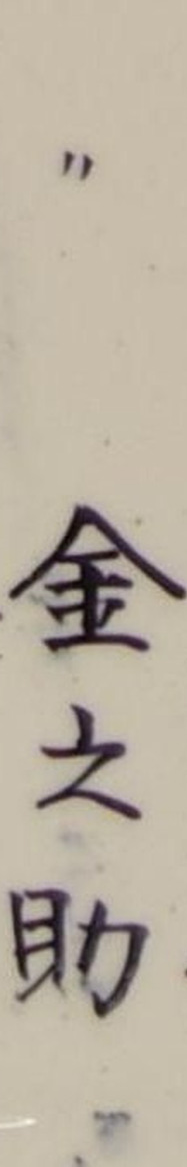金之助
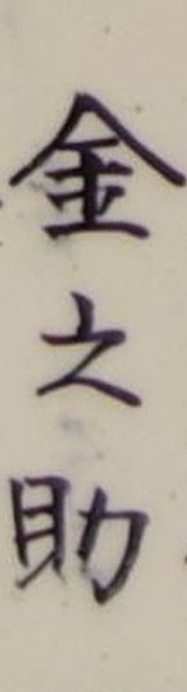金之助
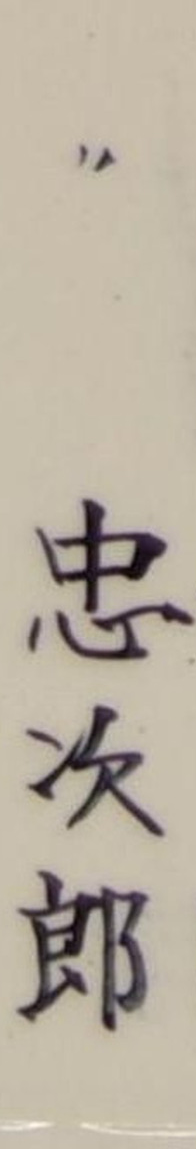忠次郎
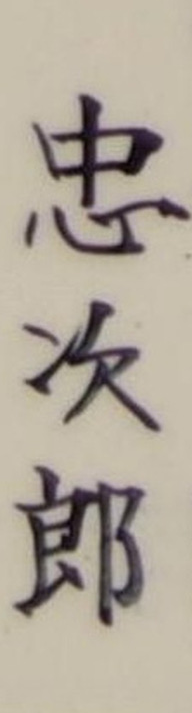忠次郎

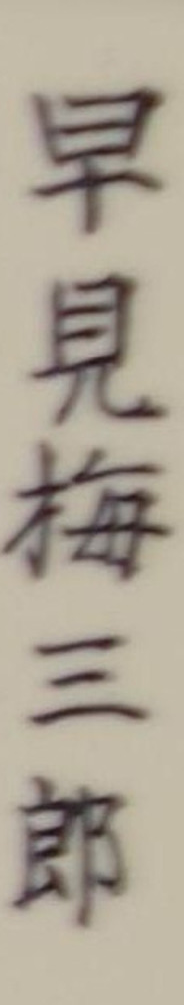早見梅三郎
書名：M~S
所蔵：高野山金剛峯寺
